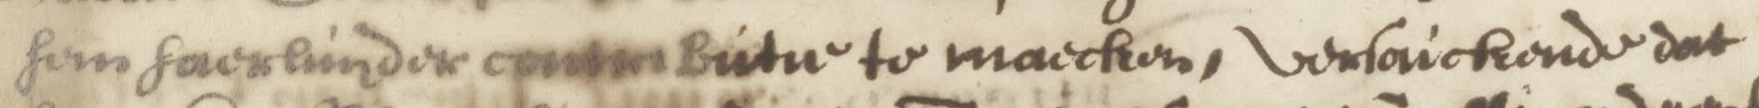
hem haerluyder contributie te maecken, versouckende dat
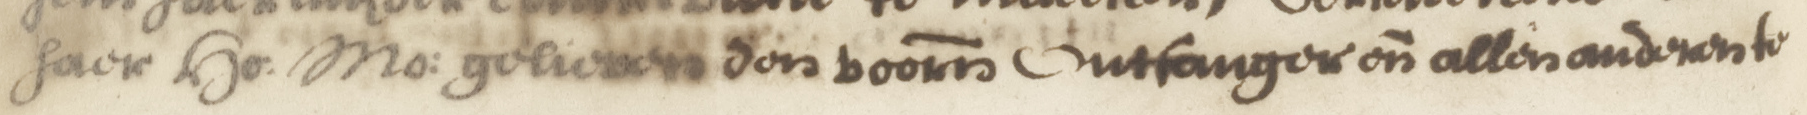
haer Ho:Mo: gelieven den voorn Ontfanger en allen anderen te
